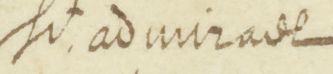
Lt. admirael
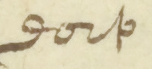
dorp
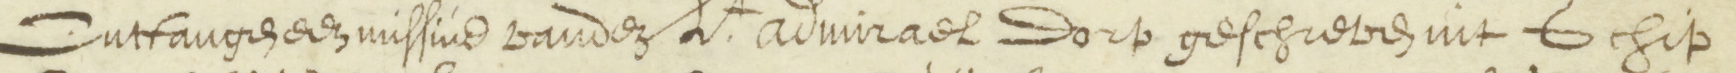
Ontfangen een missive vanden Lt. Admirael Dorp geschreven int Schip
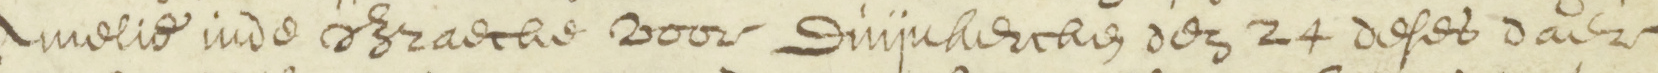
Amelie inde Braecke voor Duijnkercken den 24 deses daer
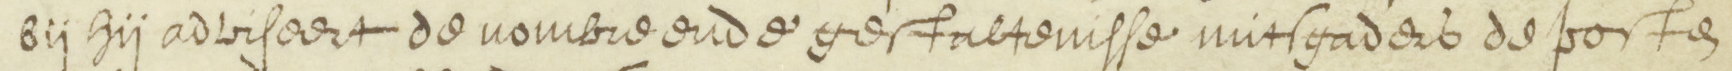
bij hij adviseert de nombre ende gestaltenisse mitsgaders de posten
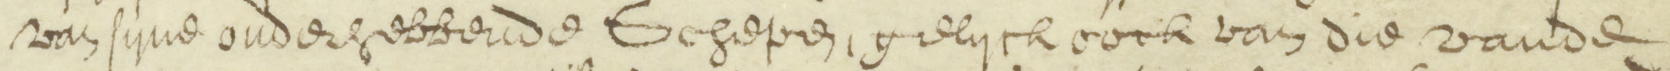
van syne onderhebbende Schepen, gelyck oock van die vande
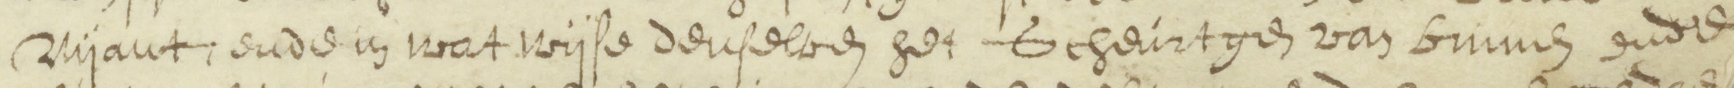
Vijant, ende in wat wijse denselven het Scheurtgen van binnen ende
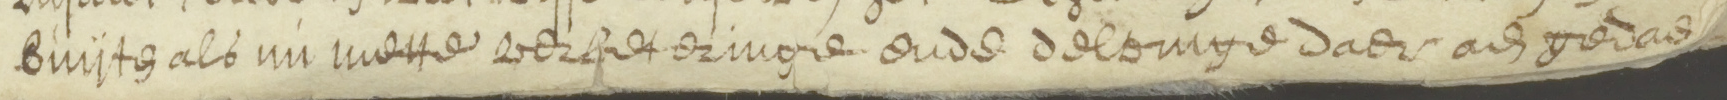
buijten als nu mette verbeteringe ende delvinge daer aen gedae
